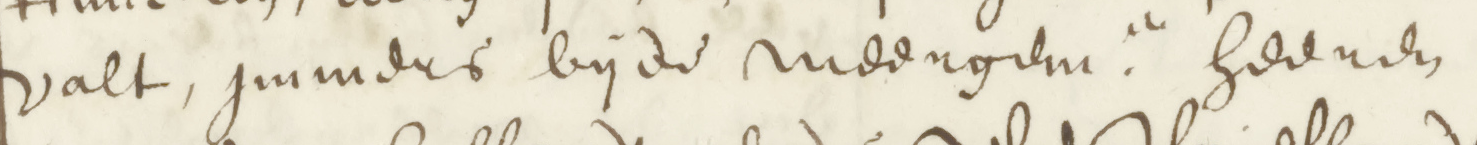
valt, immers bij de meergeme. heeren
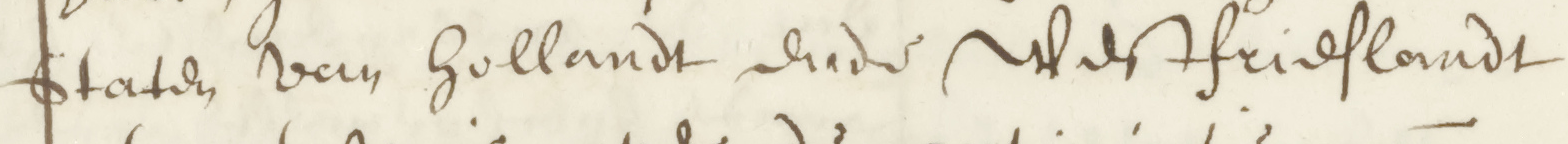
Staten van Hollandt ende Westfrieslandt
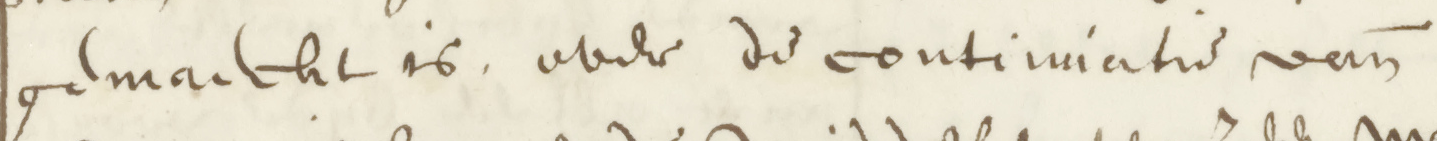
gemaeckt is, over de continuatie van
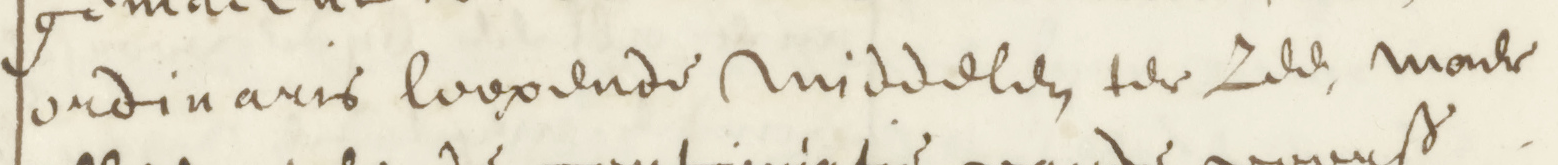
ordinaris loopende middelen ter zee, maer
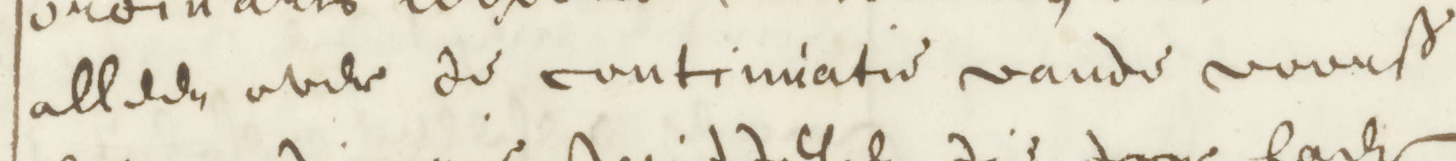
alleen over de continuatie vande voors
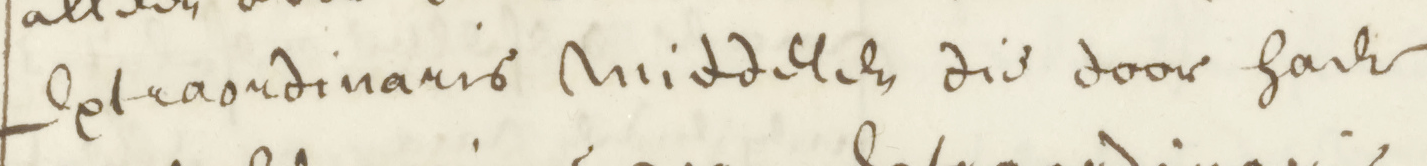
extraordinaris middelen die door haer
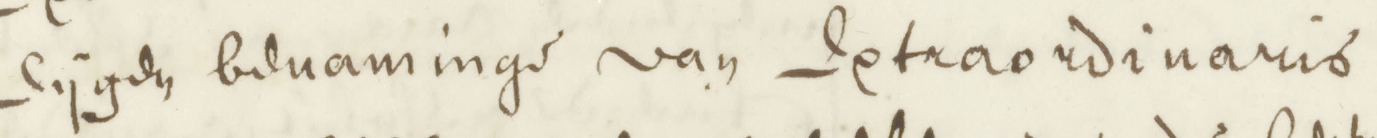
eijgen benaminge van extraordinaris
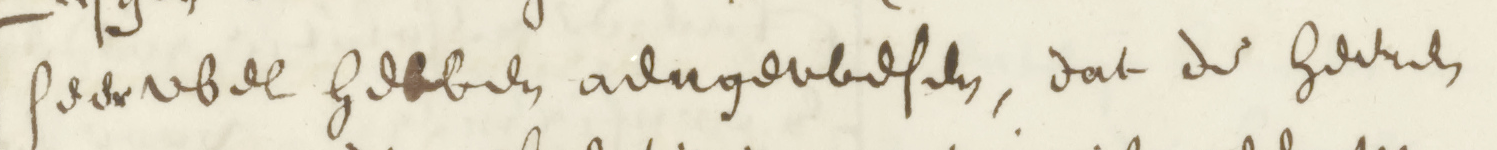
seer wel hebben aengewesen, dat de heeren
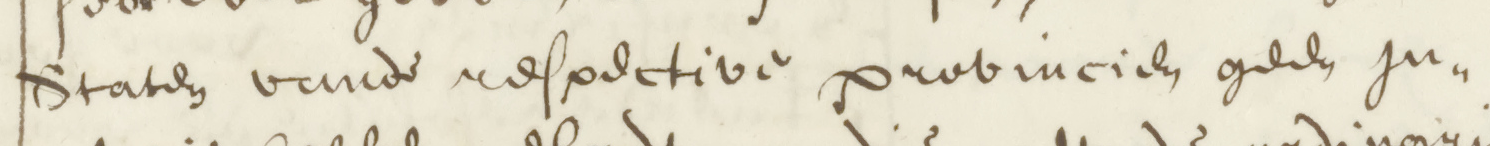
Staten vande respective provincien geen in„
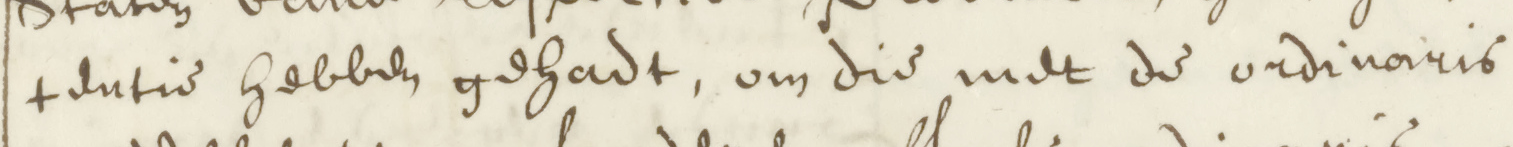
tentie hebben gehadt, om die met de ordinaris
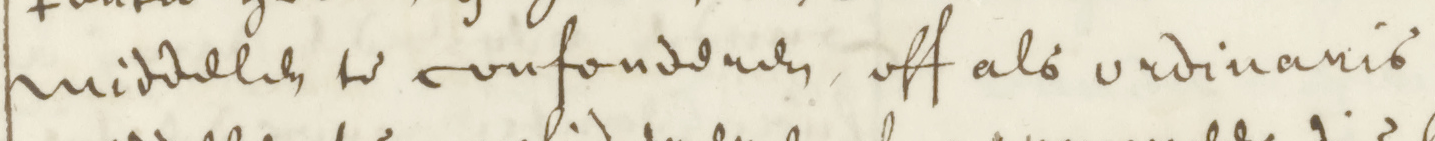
middelen te consenderen, off als ordinaris
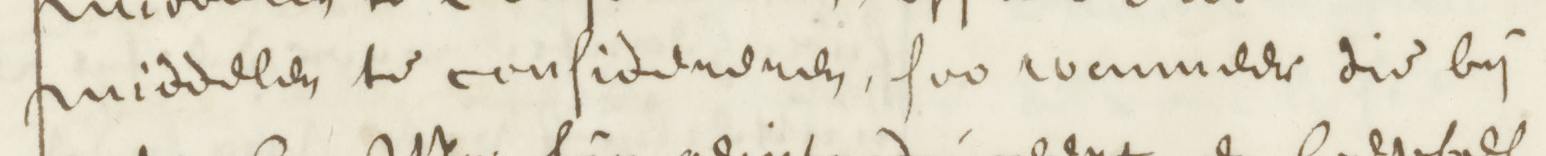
middelen te considereren, soo wanneer die bij
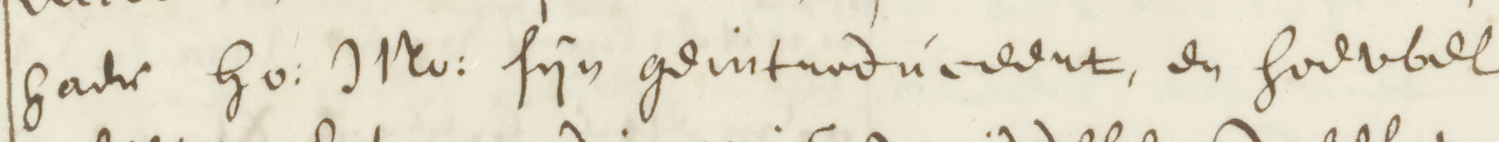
haer ho:Mo: sijn geintroduceert, en hoewel
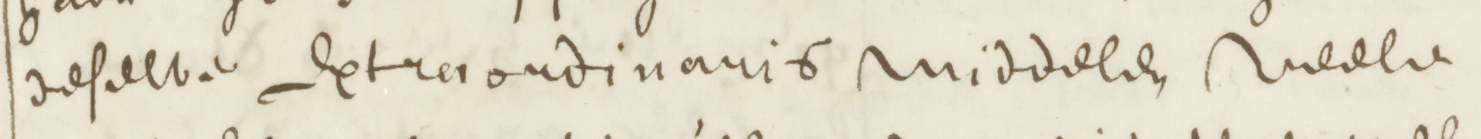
deselve extraordinaris middelen veele
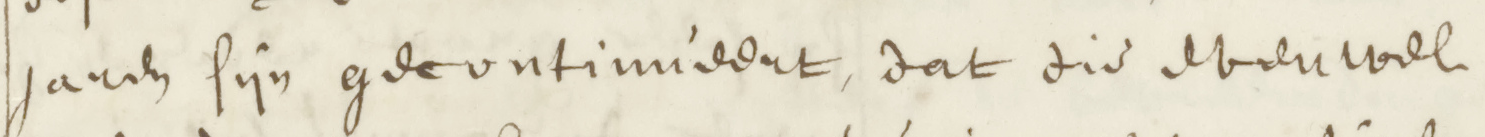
jaren sijn gecontinueert, dat die evenwel
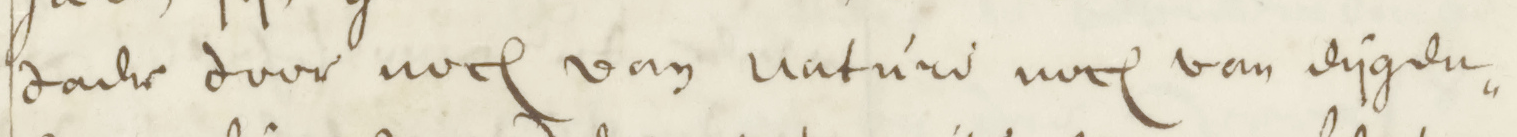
daer door noch van nature noch van eijgen,,
